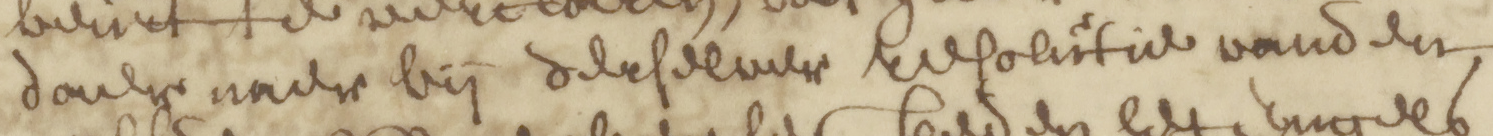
daer naer bij derselver resolutie vanden
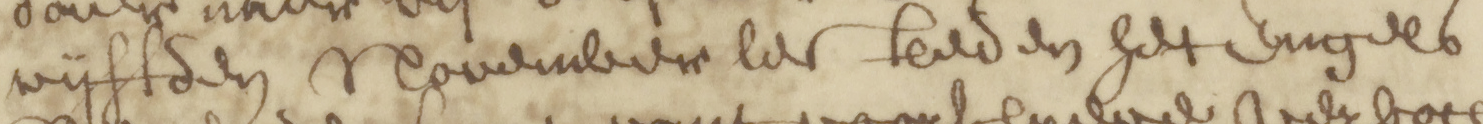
vijffden November lestleden het Engels
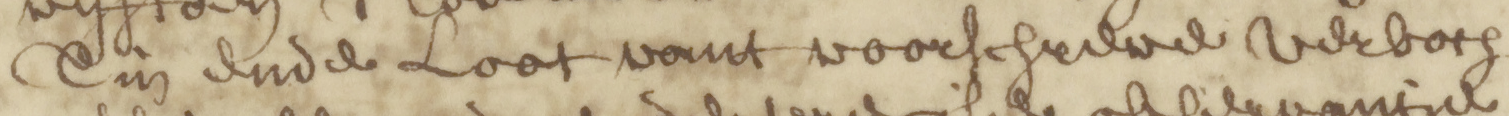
Tin ende Loot vant voorschreve verboth
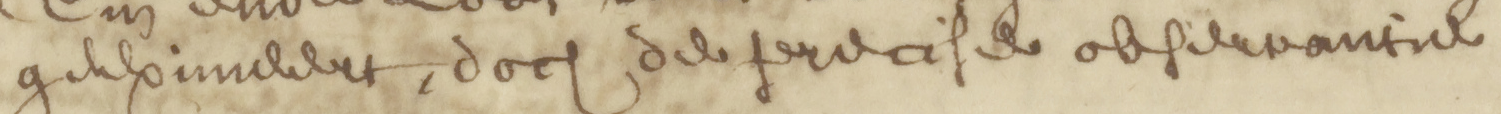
geeximeert, doch de precise observantie
